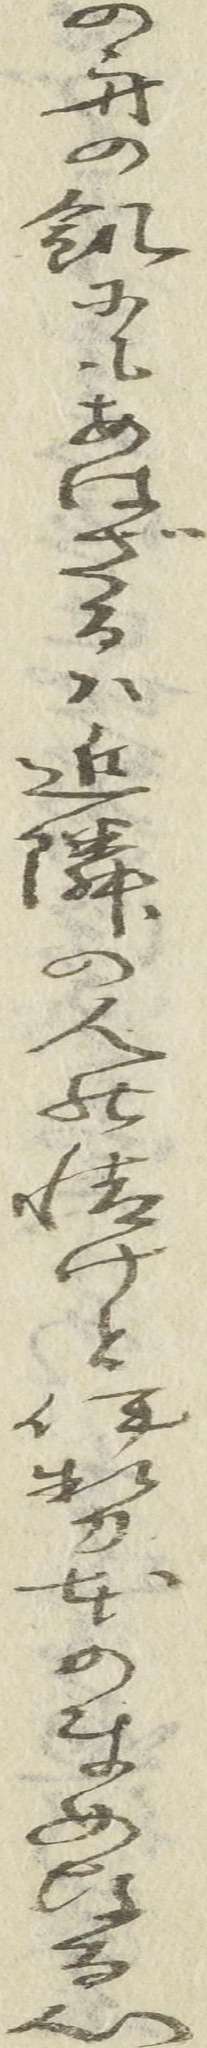の身の飢にもあはざるは近隣の人の情けと伊勢本のまめなる心
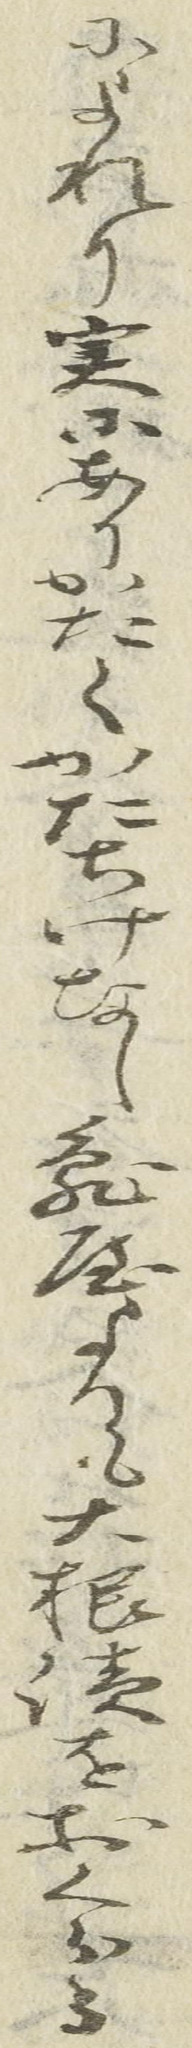によれり実にありかたくかたちけなし亀屋よりも大根漬をおくらる
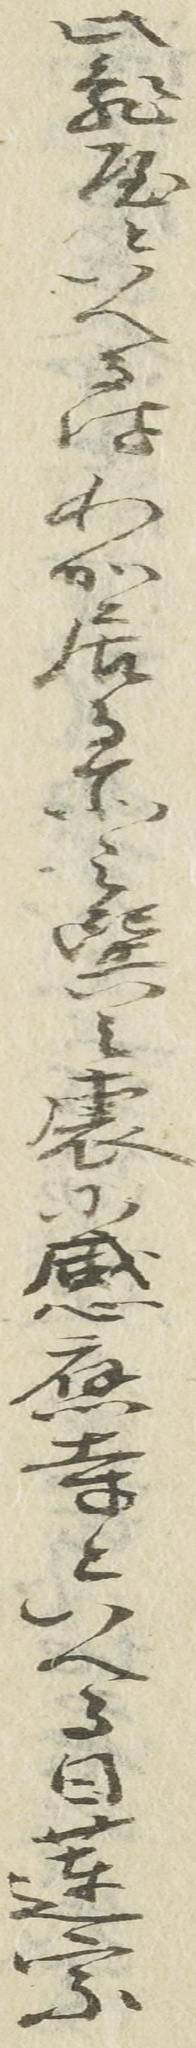此亀屋といへるはわか居る所之巽之裏に感応寺といへる日蓮宗
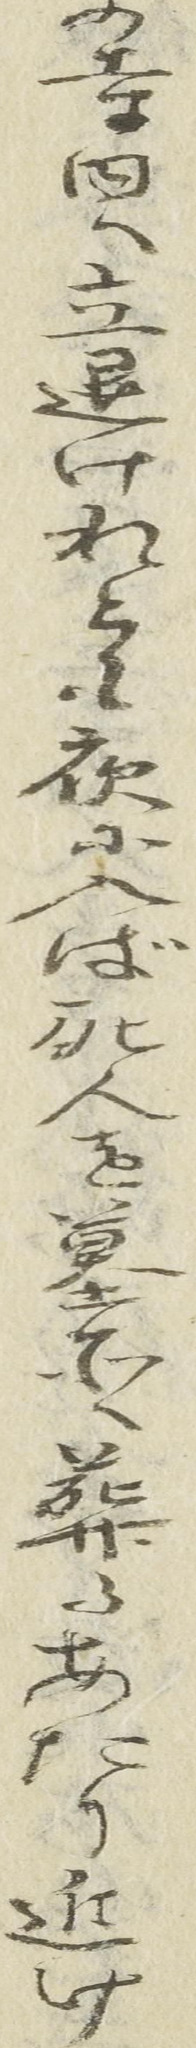の寺内へ立退けれとも夜に入ば死人を墓所へ葬るあたり近け
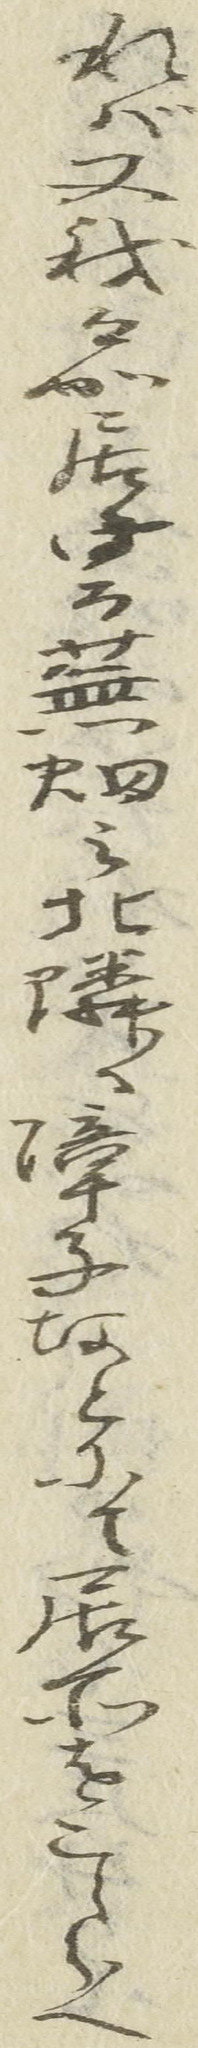れば又我々か居はる蕪畑の北隣へ障子なとにて居所をこしらへ
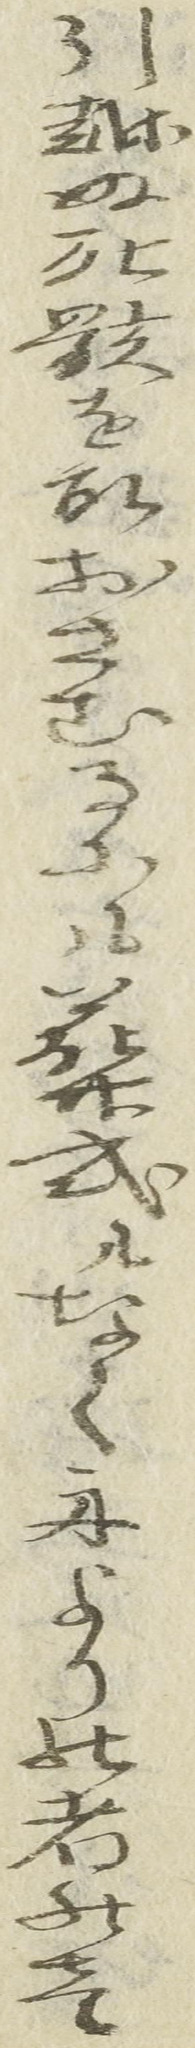引越ぬ死骸を取おさむるにも葬式もなく身よりの者の壱
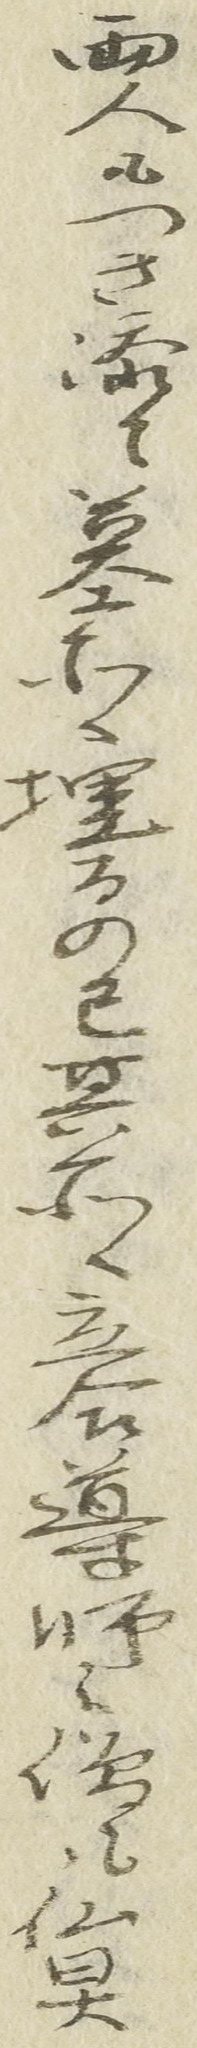両人もつき添て墓所へ埋るのみ其所へ立合導師之僧も仏具
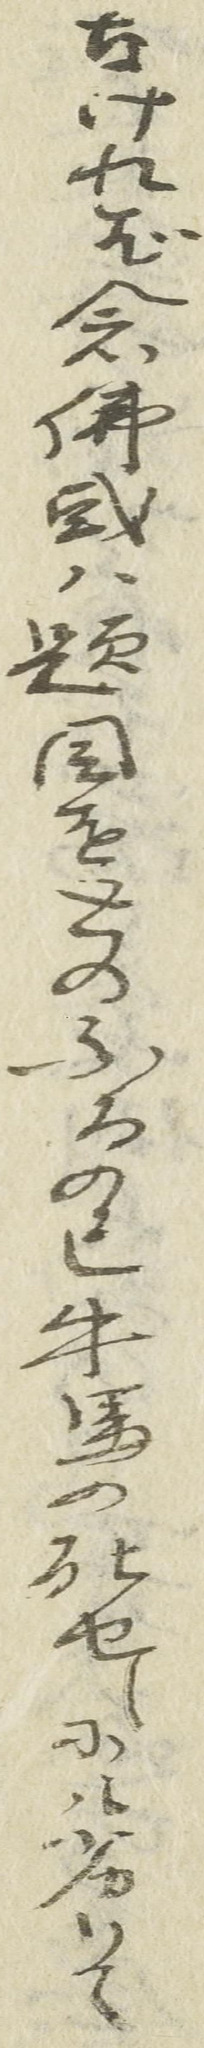なければ念仏或は題目をとのふるのみ牛馬の死せしにも劣りて
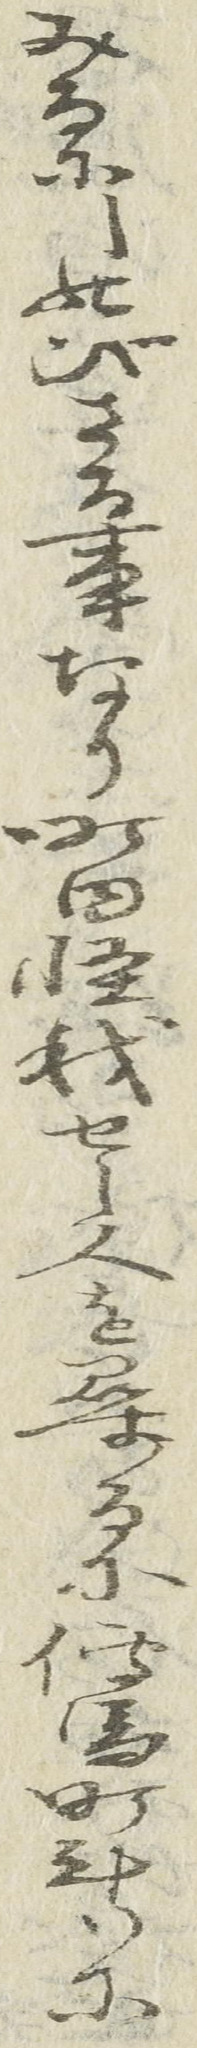みるにしのびさる事なり町内怪我せし人を尋るに伝馬町斗りに
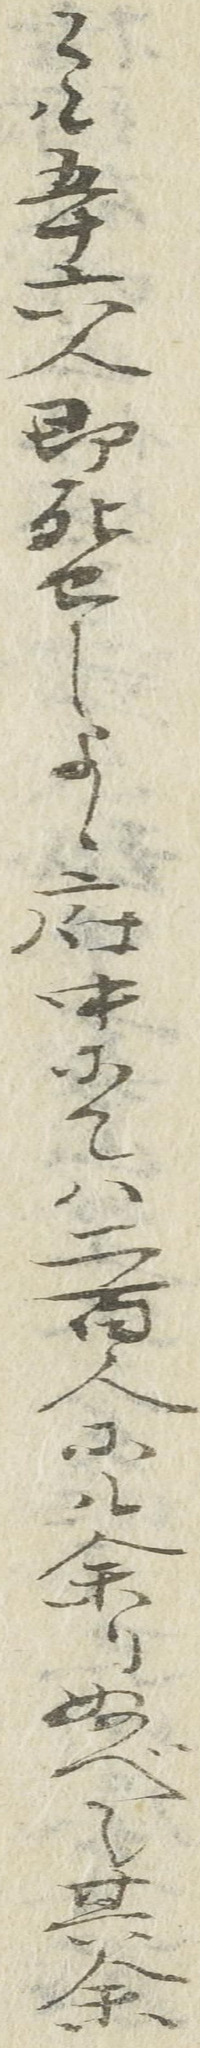ても五十六人即死せしよし府中にては二百人にも余りぬべし其余
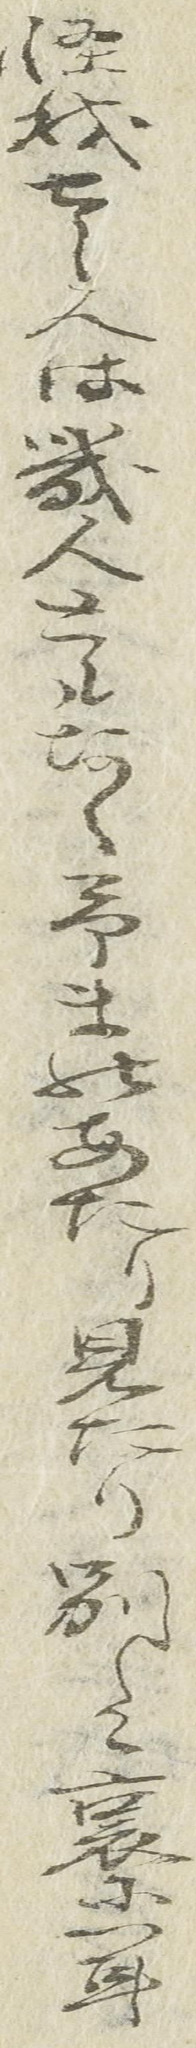怪我せし人は幾人ともなく予まのあたり見たり別して哀に聞
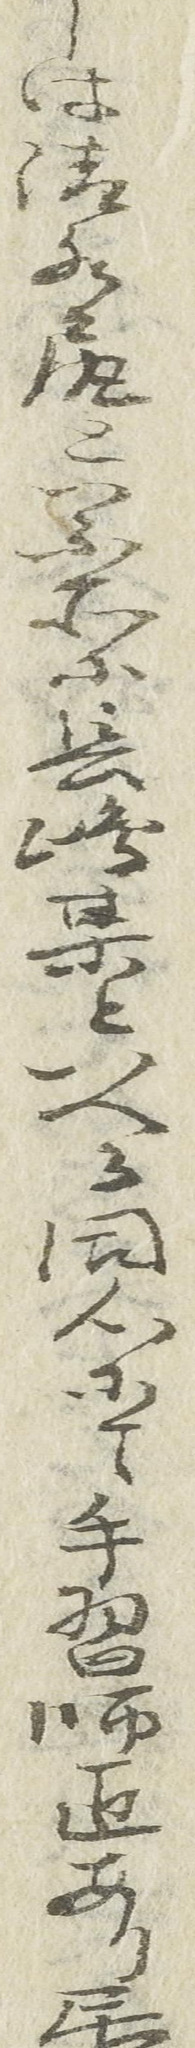しは清水尻といふ所に長嶋某といへる同心にて手習師匠あり居
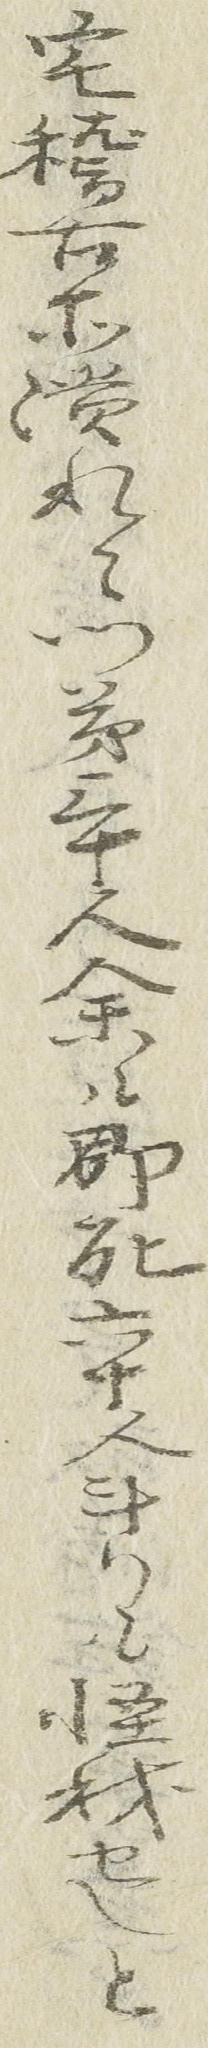宅稽古所潰れて門弟三十人余も即死六十人斗りも怪我せしと
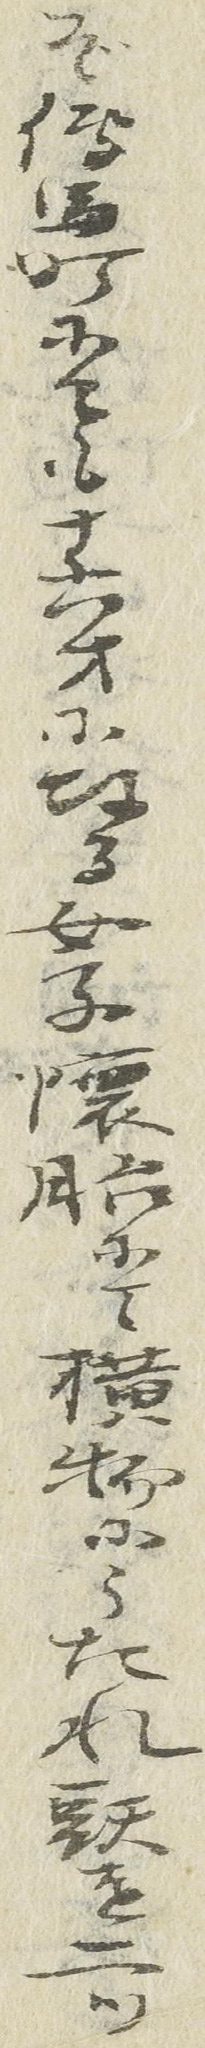ぞ伝馬町にても十六才になる女子懐胎にて横物にうたれ頭を二ツ
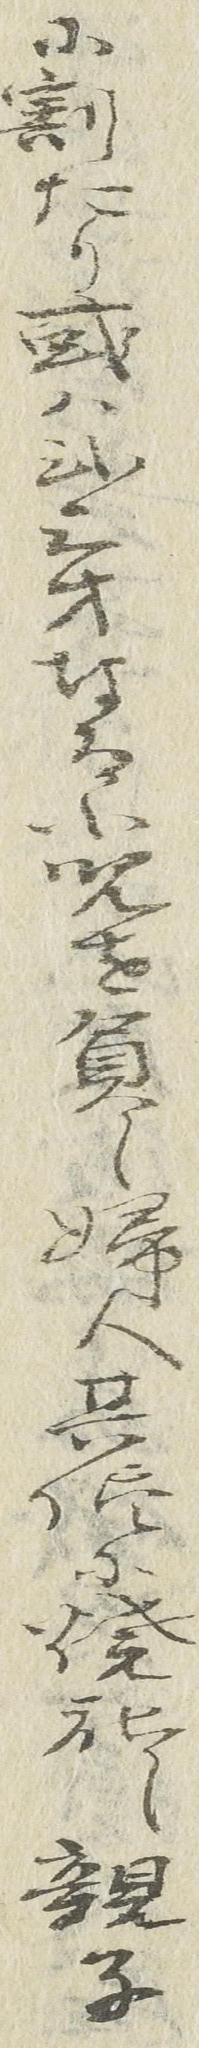に割たり或は弐三才なる小児を負し婦人其儘に焼死し親子
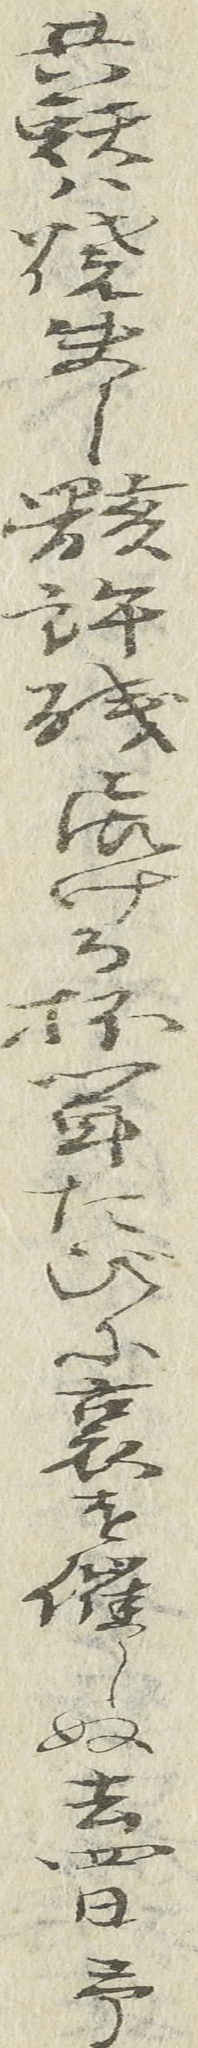共頭ハ焼失し骸許残居ける抔聞たびに哀を催しぬ去四日予
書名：地震前兆集　全
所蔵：東京大学地震研究所図書室 Earthquake Research Institute Library, The University of Tokyo, JAPAN
